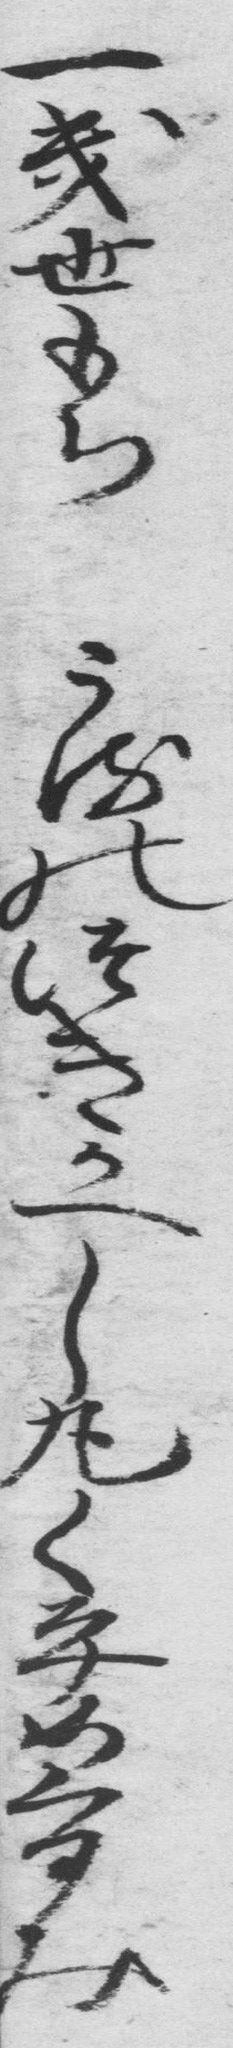一幾世もちうるのつきかへし丸く平めくるみ
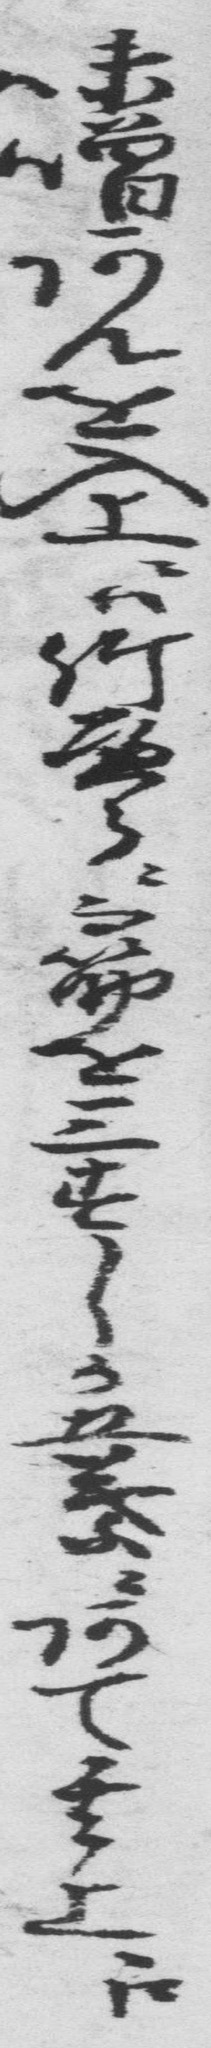味噌あんを入上には竹へらにて筋を三すしか五葉にあて其上え
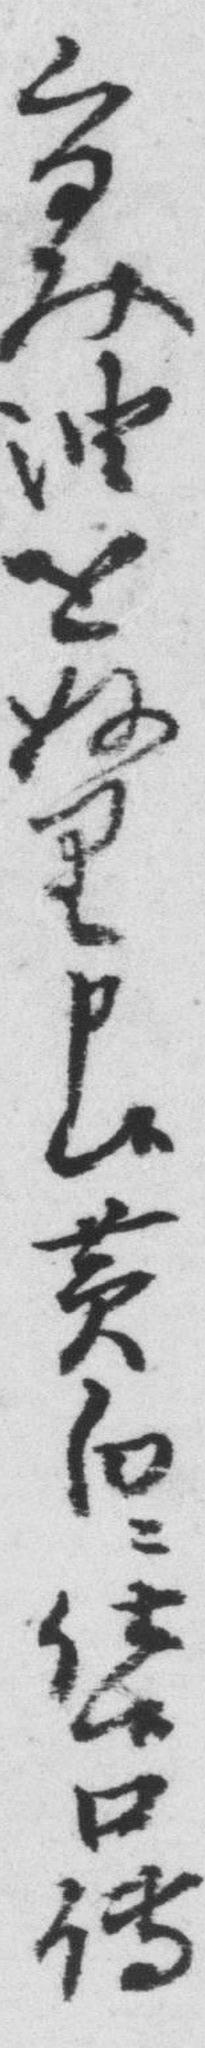くるみ油をぬり申候黄白に仕候口伝
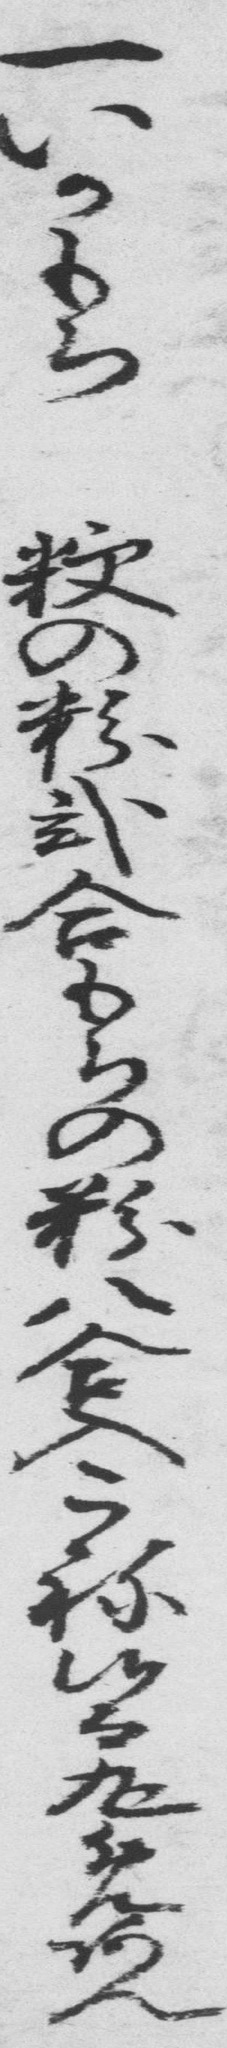一いかもち粳の粉弐合もちの粉八合入こね候て丸めあん
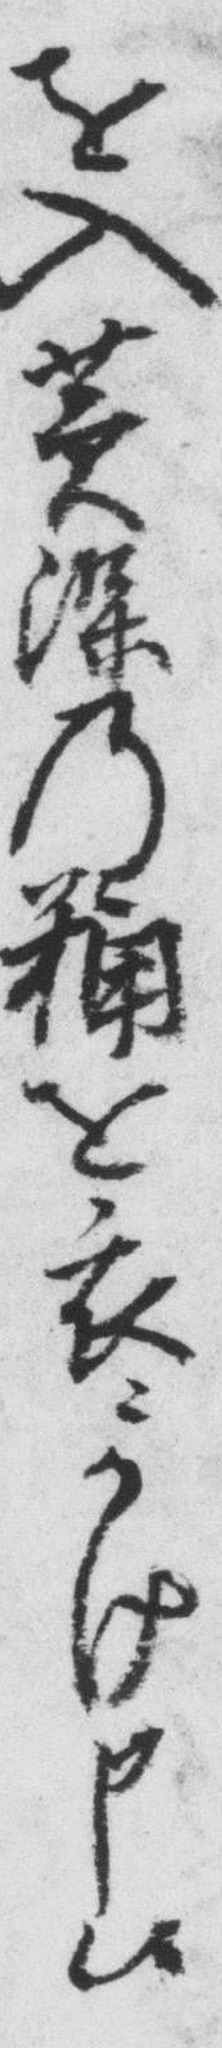を入黄染の糒を衣にかけ申候
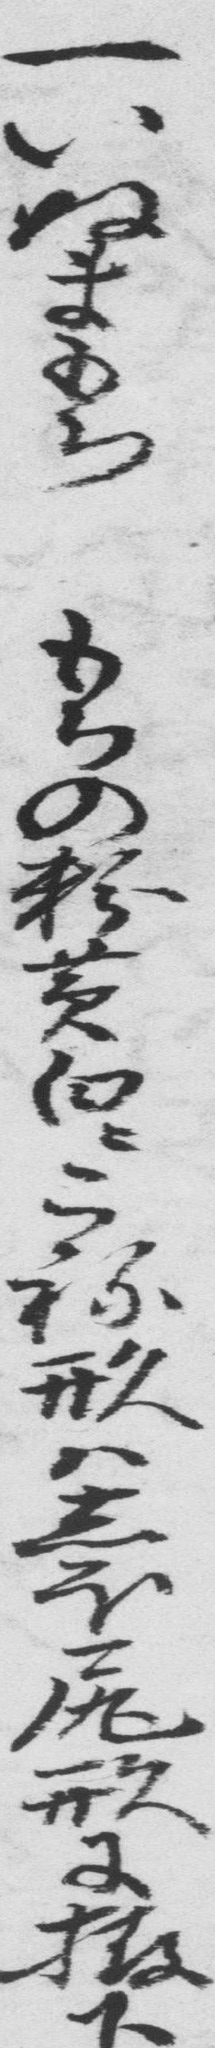一いぬまもちもちの粉黄白にこね形はしほ尻形に拵下
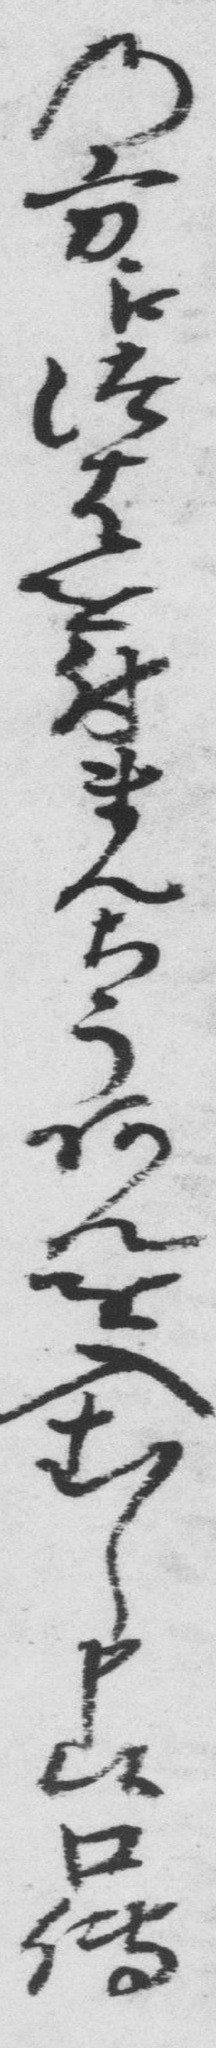の方えつはを付まんちうあんを入むし申候口伝
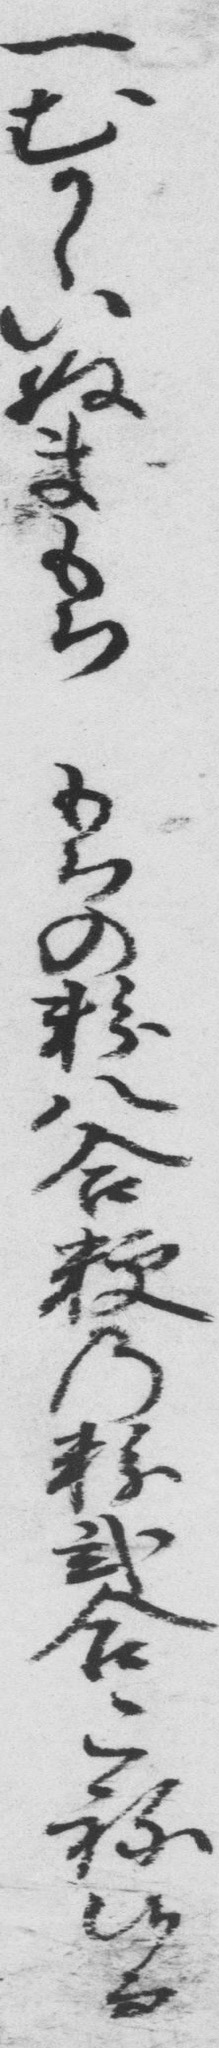一むかしいぬまもちもちの粉八合粳の粉弐合こね候て
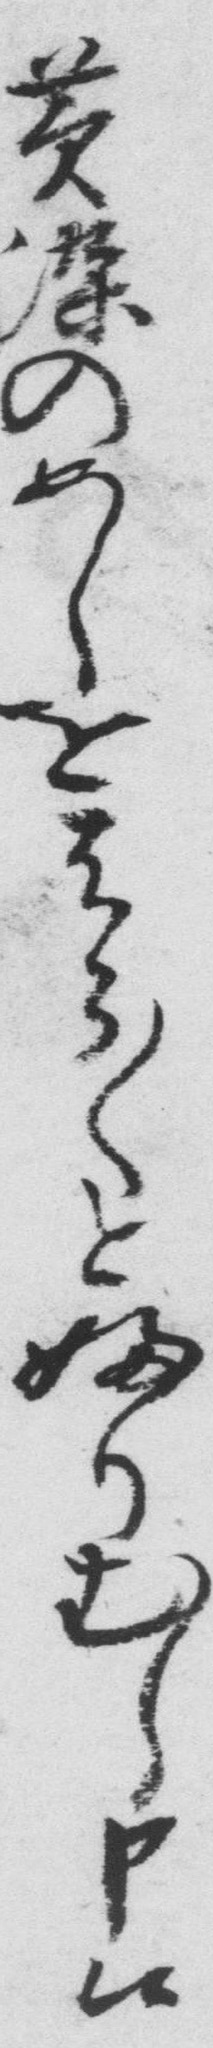黄染のめしをはら〳〵とふりむし申候
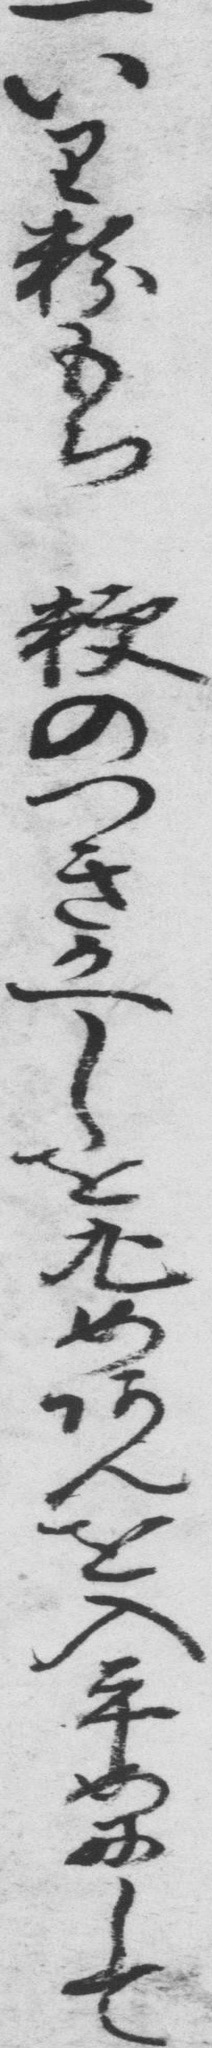一いわ粉もち粳のつきかへしを丸めあんを入平めにして
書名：料理集
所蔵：大阪府立大学学術情報センター 国文学研究資料館
